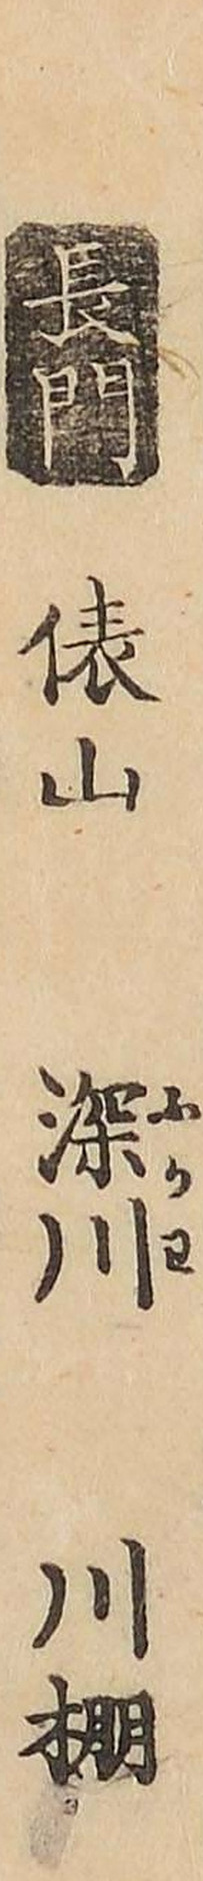長門俵山深川川棚
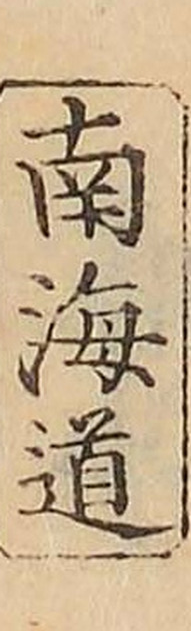南海道

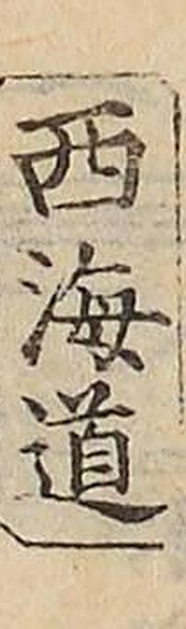西海道
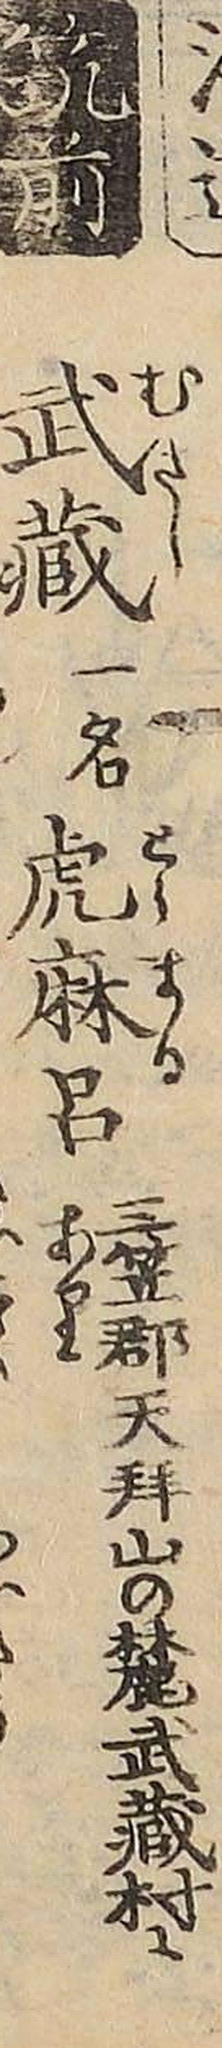筑前武蔵一名虎麻呂三笠郡天拝山の麓武蔵村にあり
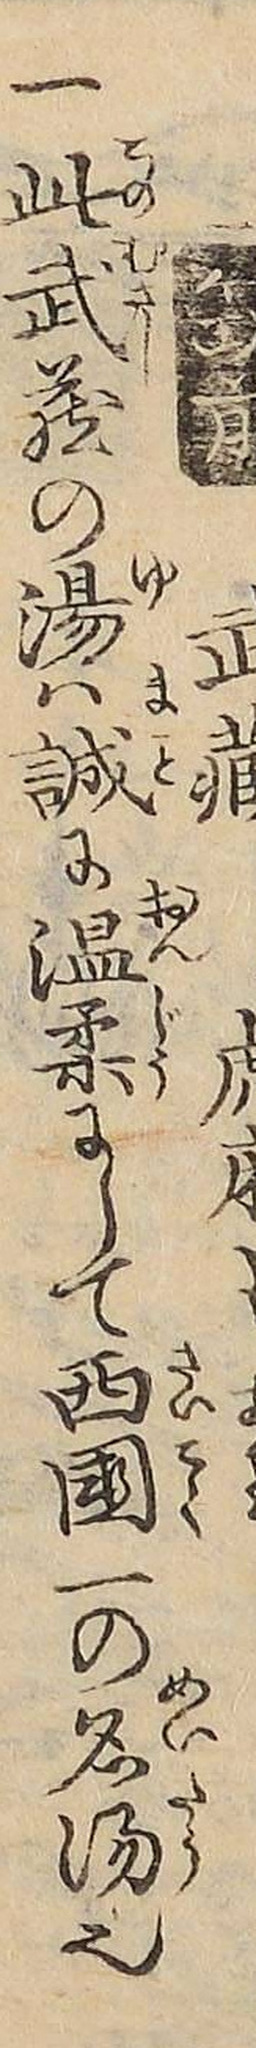一此武蔵の湯は誠に温柔にして西国一の名湯也
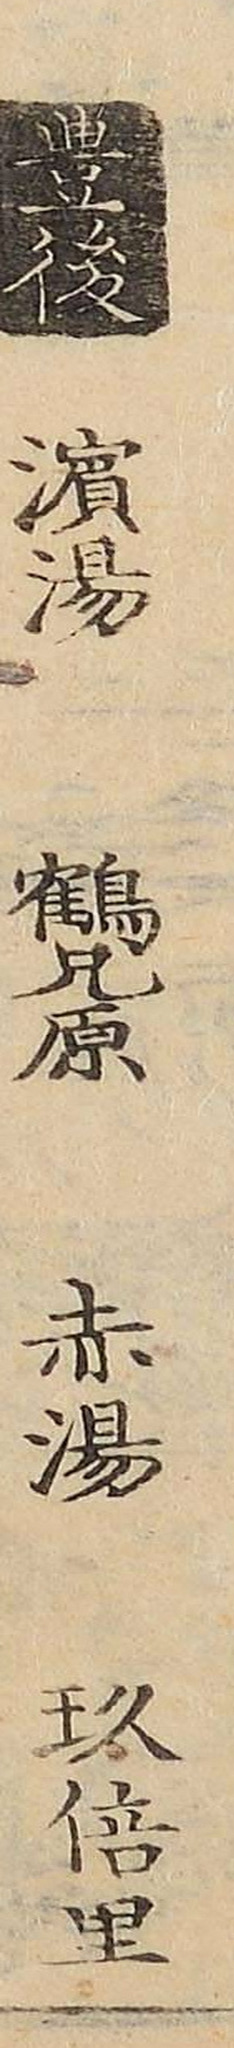豊後浜湯鶴原赤湯玖倍里
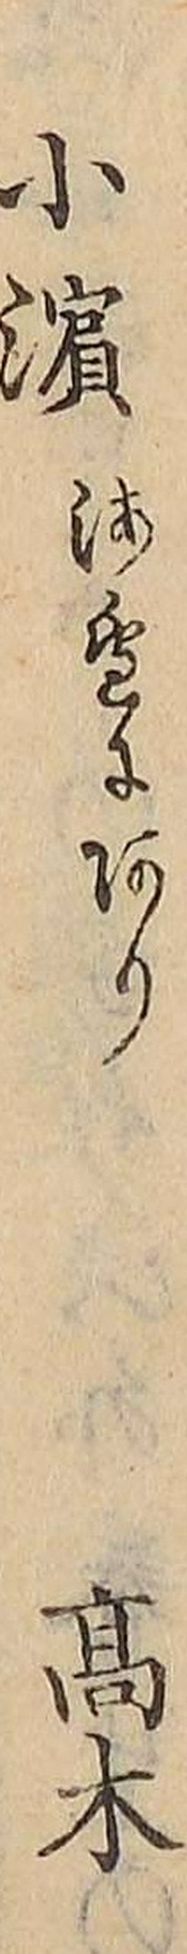小浜海辺にあり高木
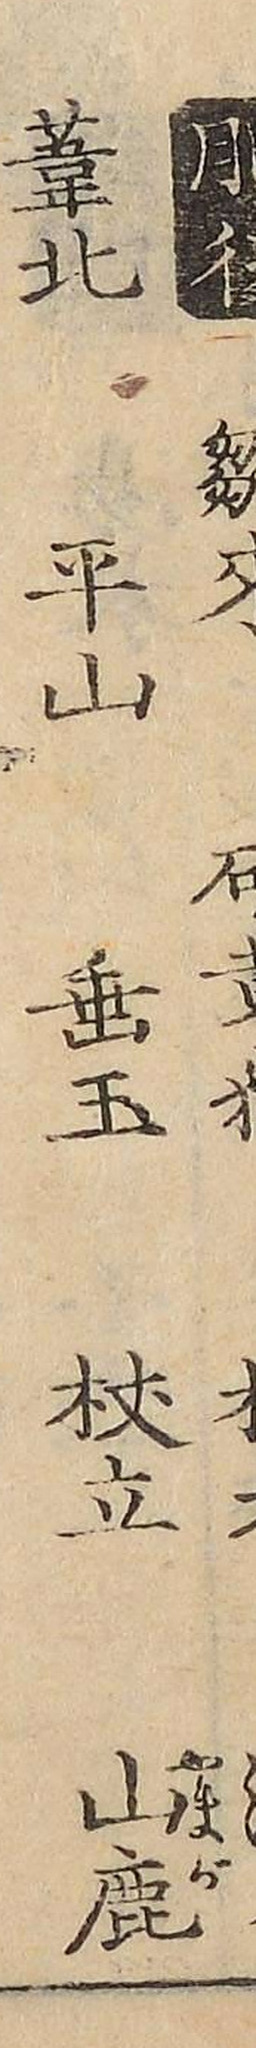葦北平山垂玉杖立山鹿
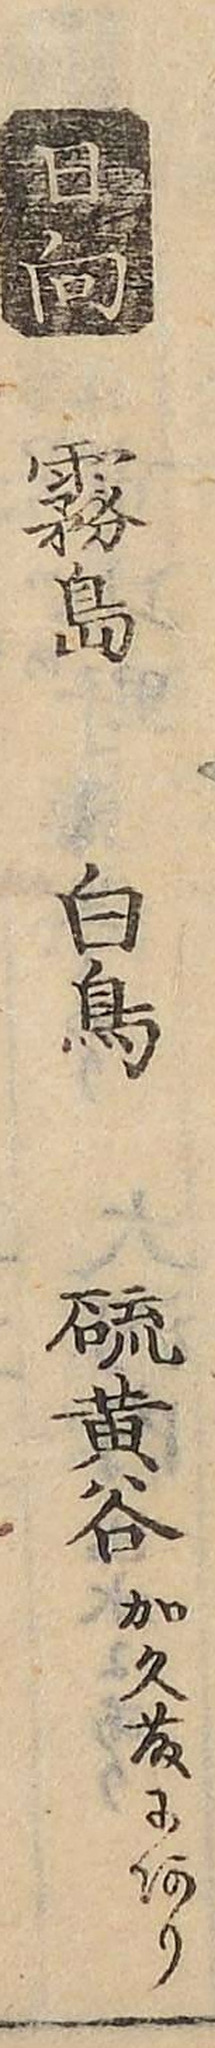日向霧島白鳥硫黄谷加久藤にあり

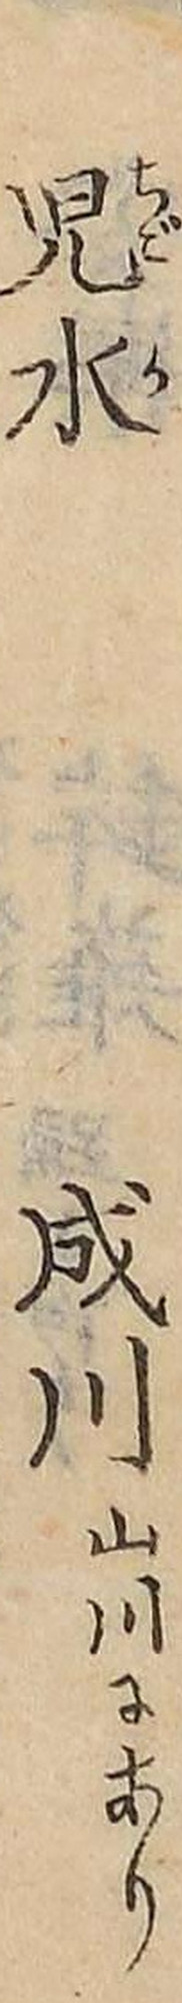児水成川山川にあり
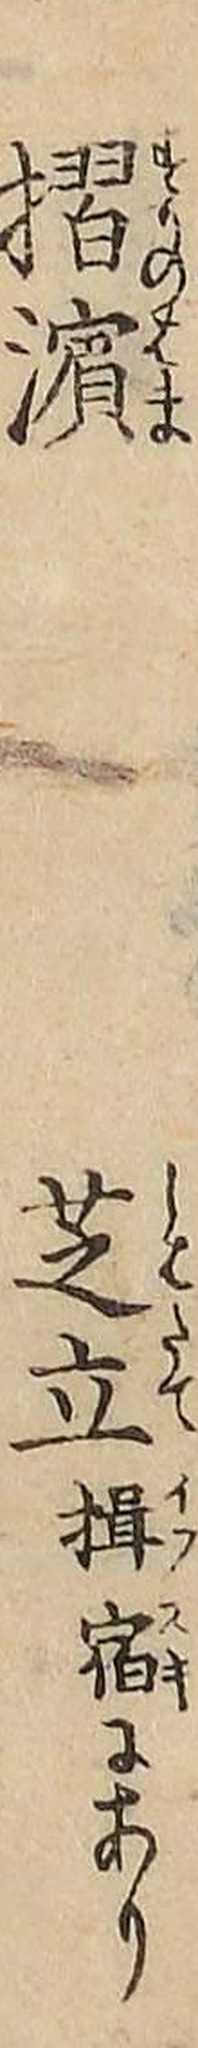摺浜芝立揖宿にあり
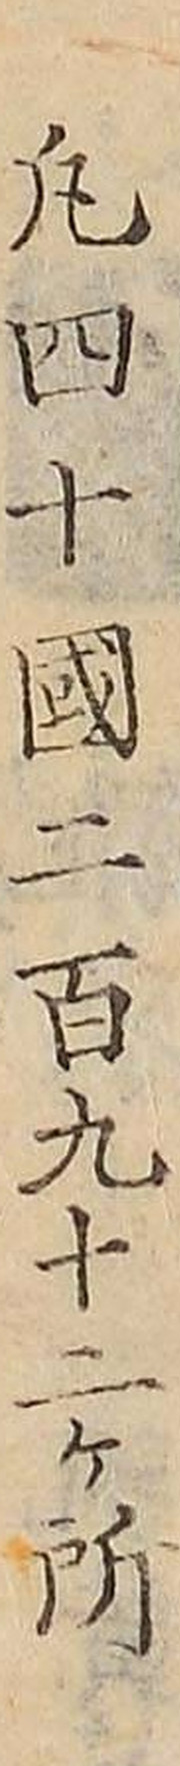凡四十国二百九十二ケ所
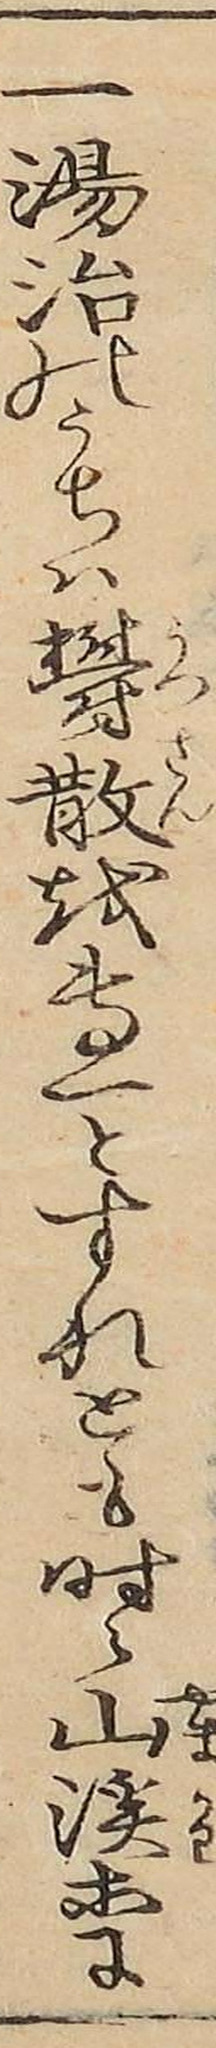一湯治のうちは欝散を専一とすれとも時々山渓等に
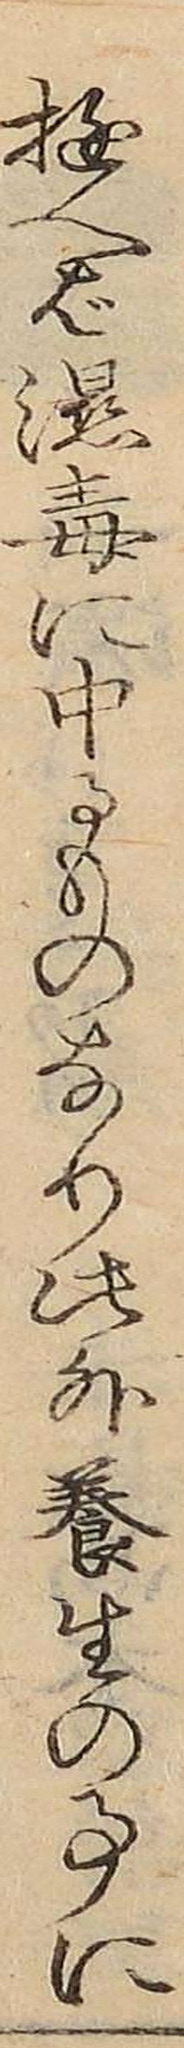遊へば湿毒に中るものなり此外養生の事に
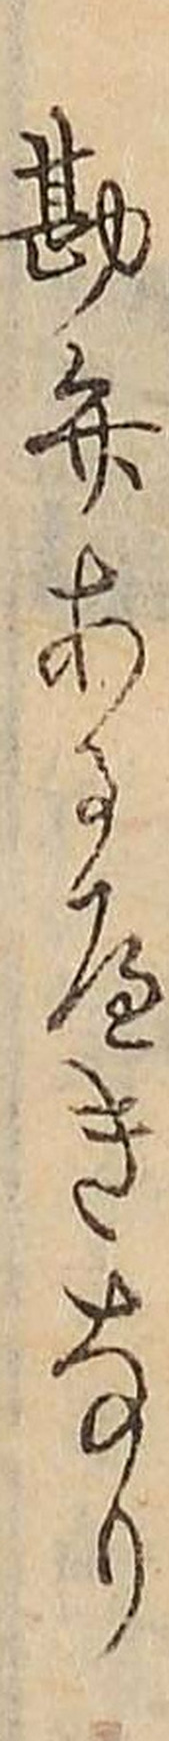勘弁あるへきなり
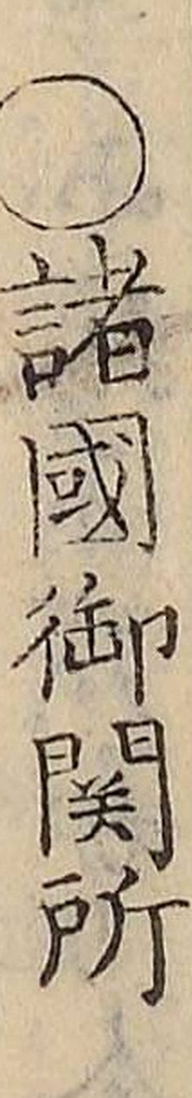○諸国御関所
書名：旅行用心集
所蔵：神戸大学附属図書館 国文学研究資料館
